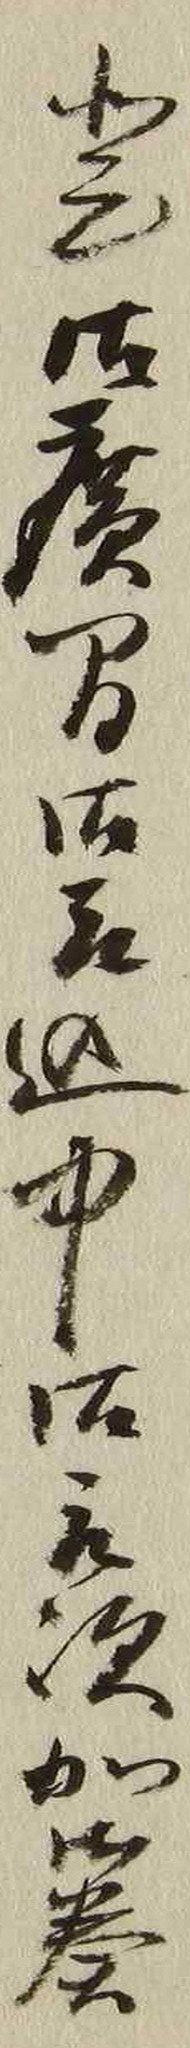登御広間御取込中御取次加御奏
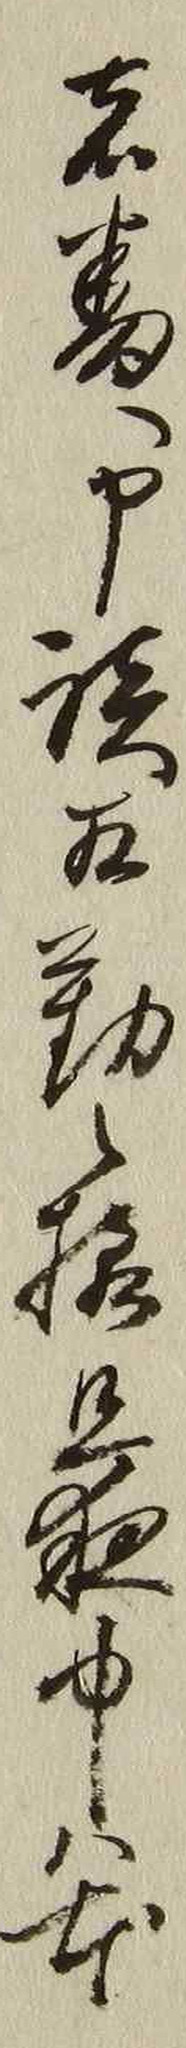者番へ申談相勤候様且夜中ハ本
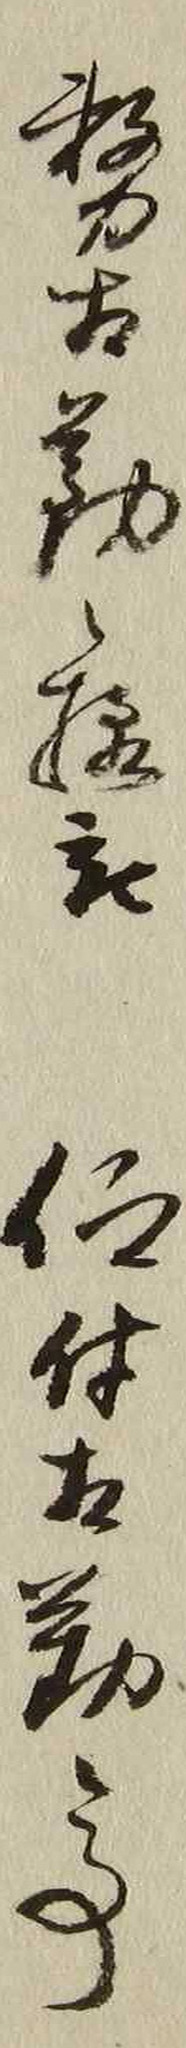務相勤候様被仰付相勤候事
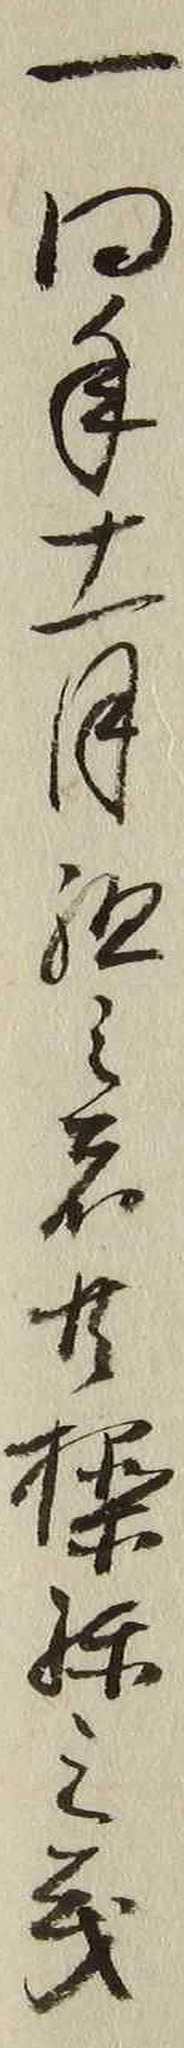一同年十一月組之者共操練之義
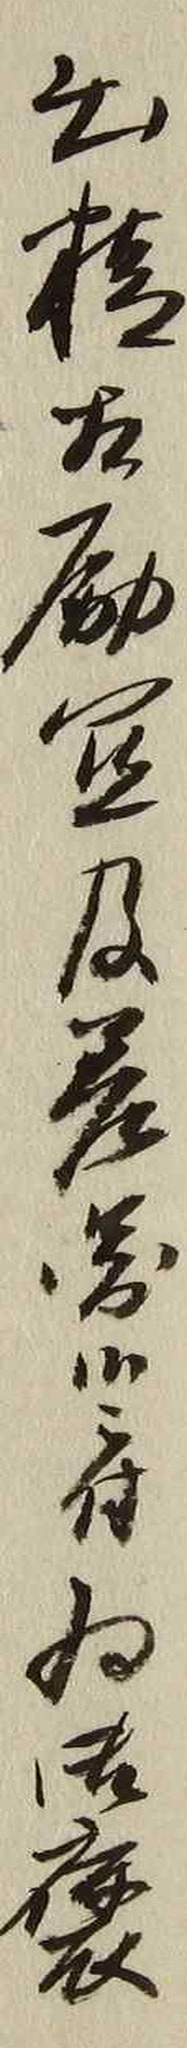出精相励宜及差図候ニ付為御褒
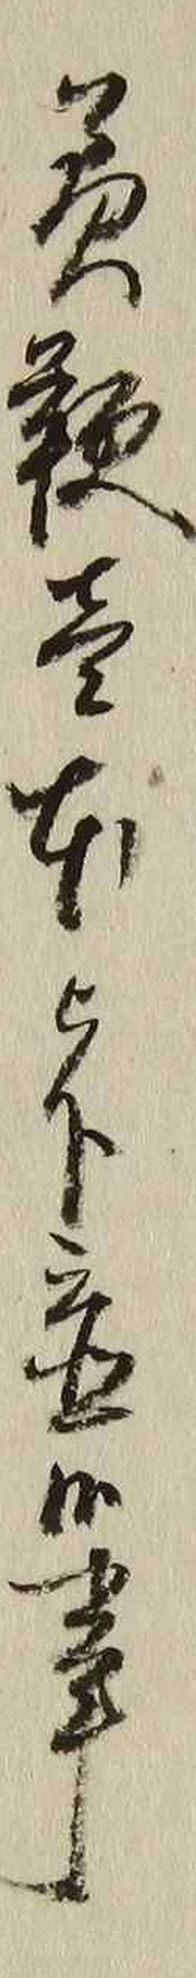美鞭壱本被下置候事
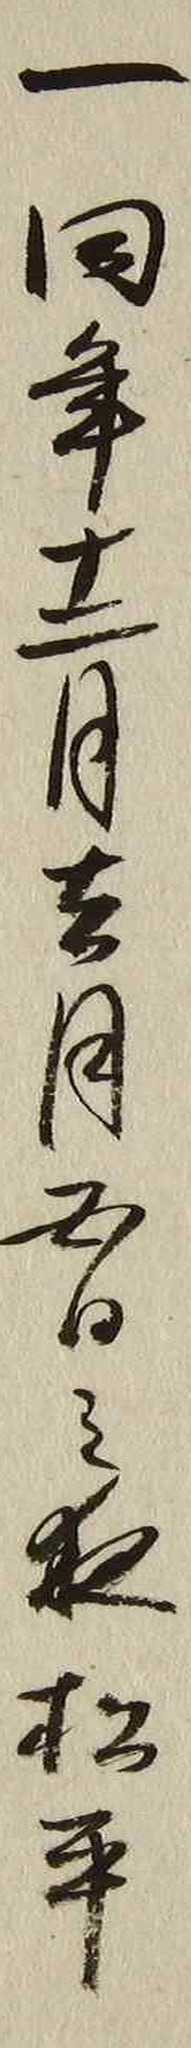一同年十二月去月五日之夜松平
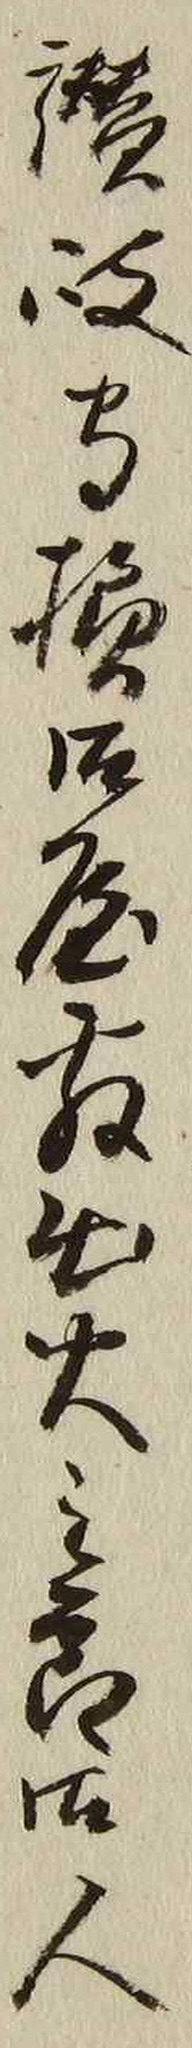讃政守様御屋敷出火之節御人
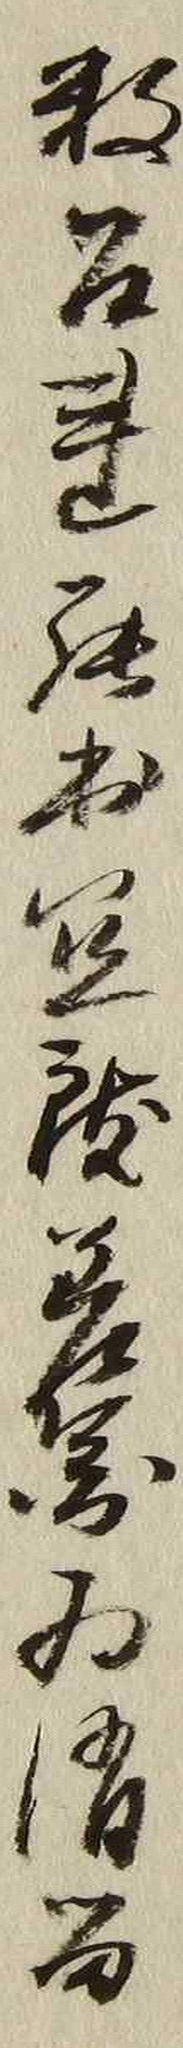数召連罷出宜致差図為消留
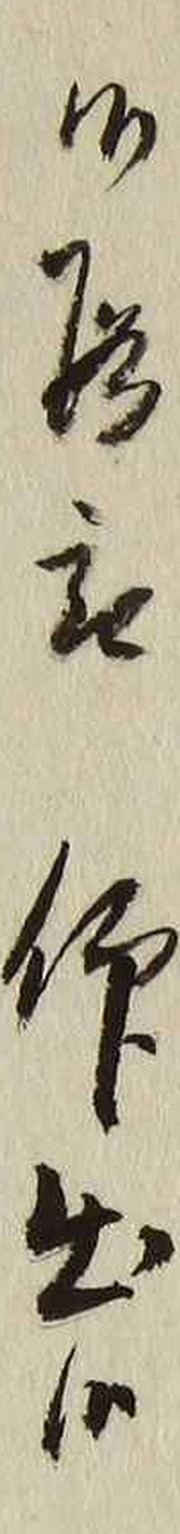候段被仰出候
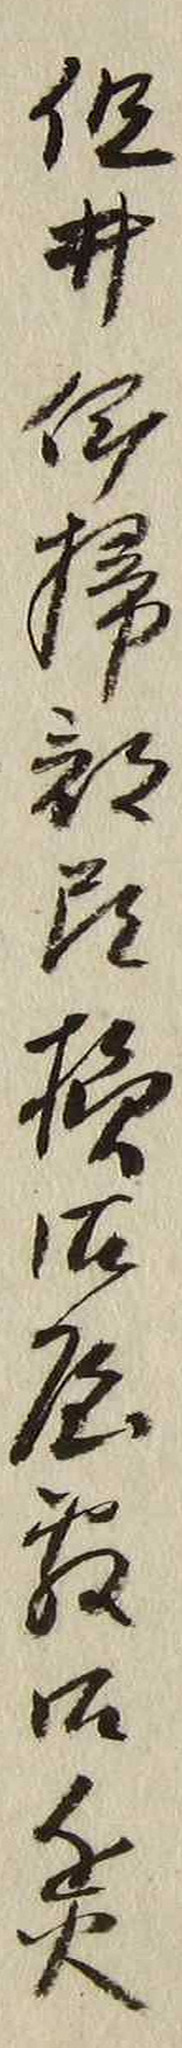但井伊掃部頭様御屋敷御近火
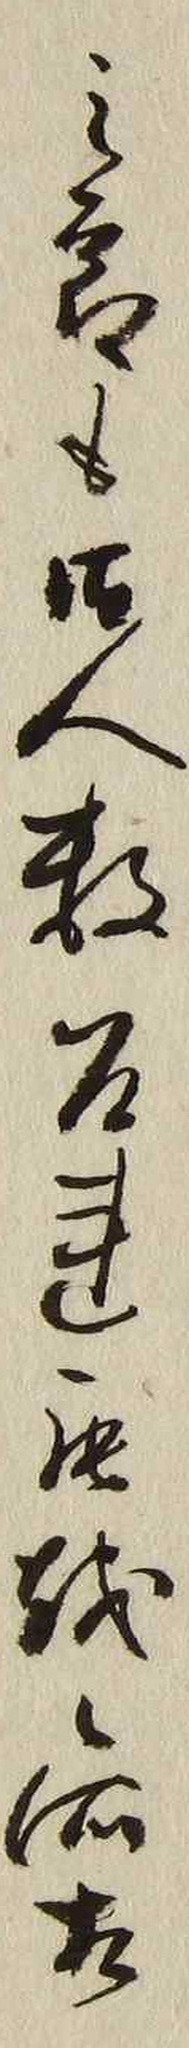之節も御人数召連罷越候所相
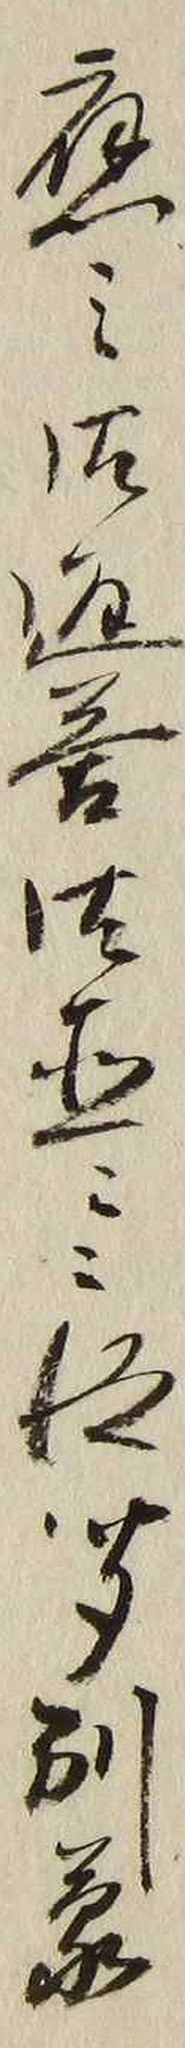応之御返答御直ニ被仰聞別蒙

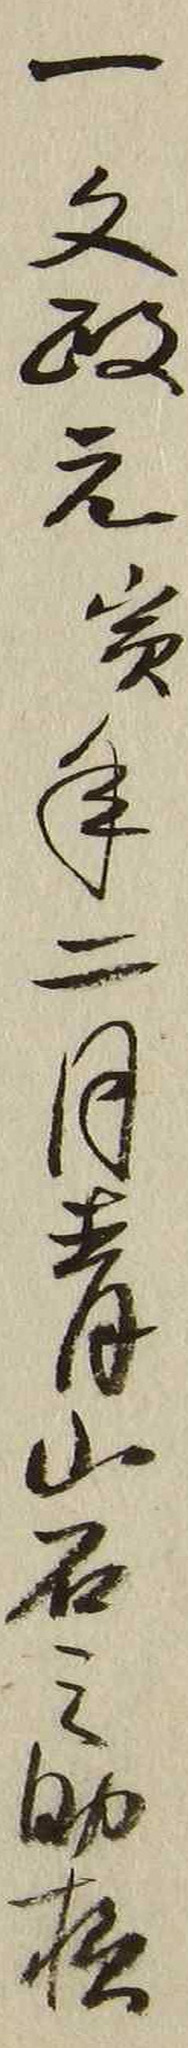一文政元寅年二月青山石之助様
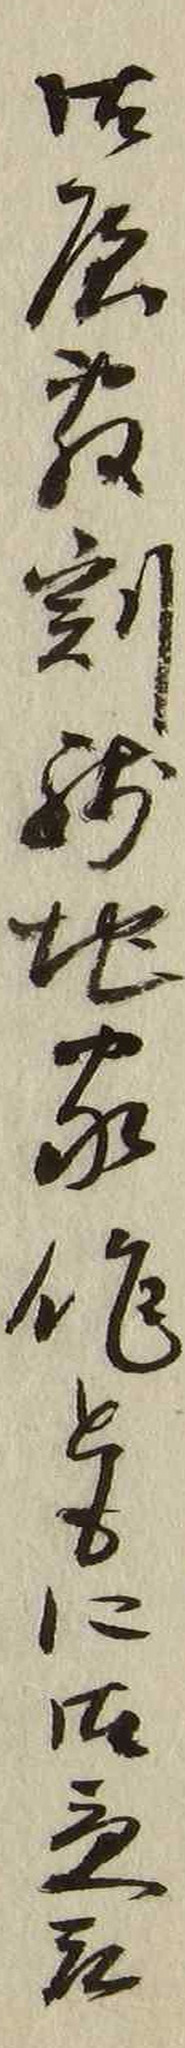御屋敷割残地家作ともに御受取
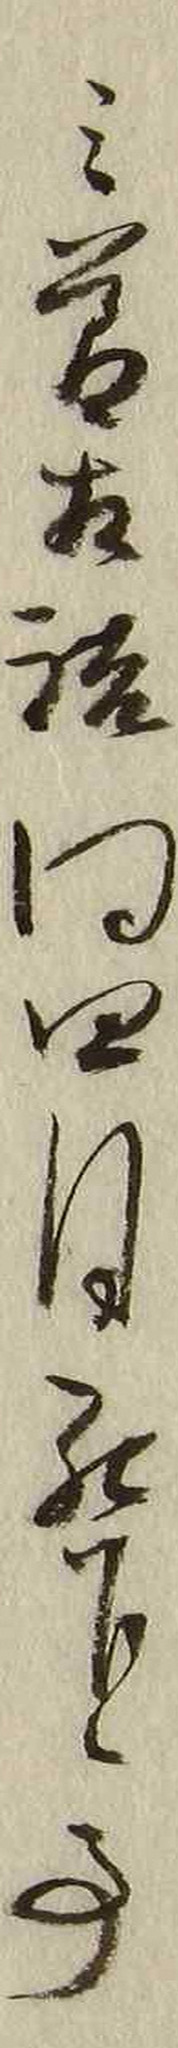之節相詰同四月罷下候事
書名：諸士系譜　巻之356　す之部6
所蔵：会津若松市立会津図書館
